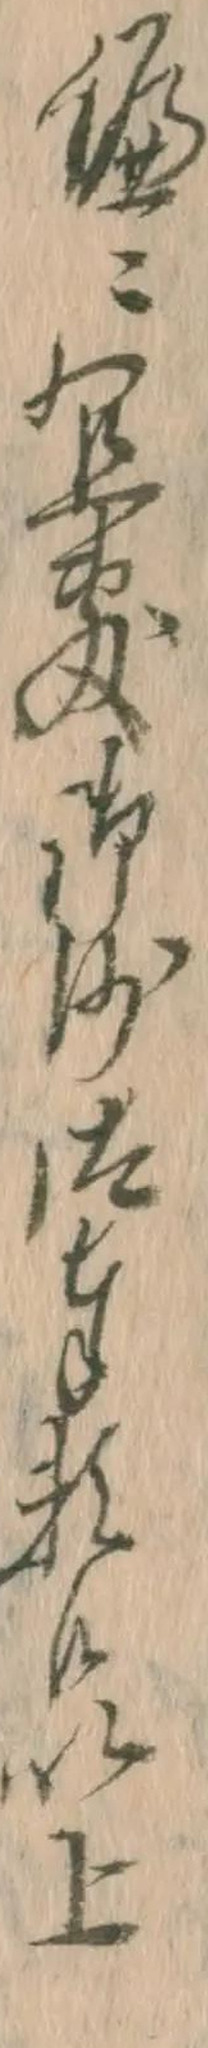偏ニ宜敷御沙汰奉頼候以上
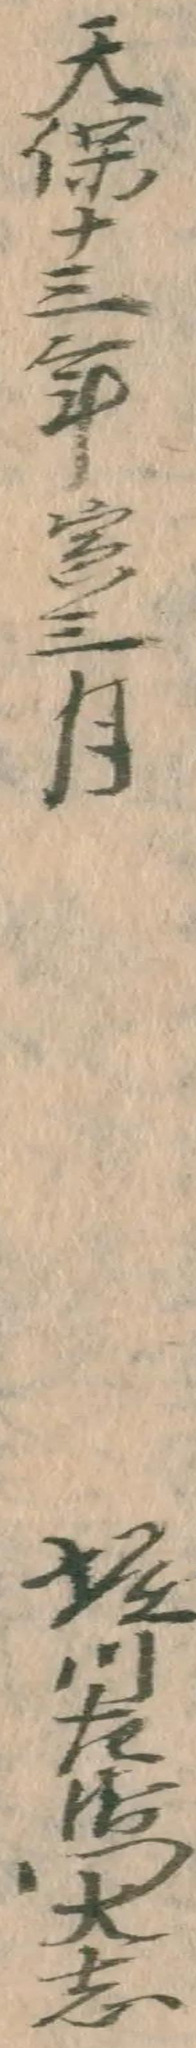天保十三年寅三月堀川左衛門大志
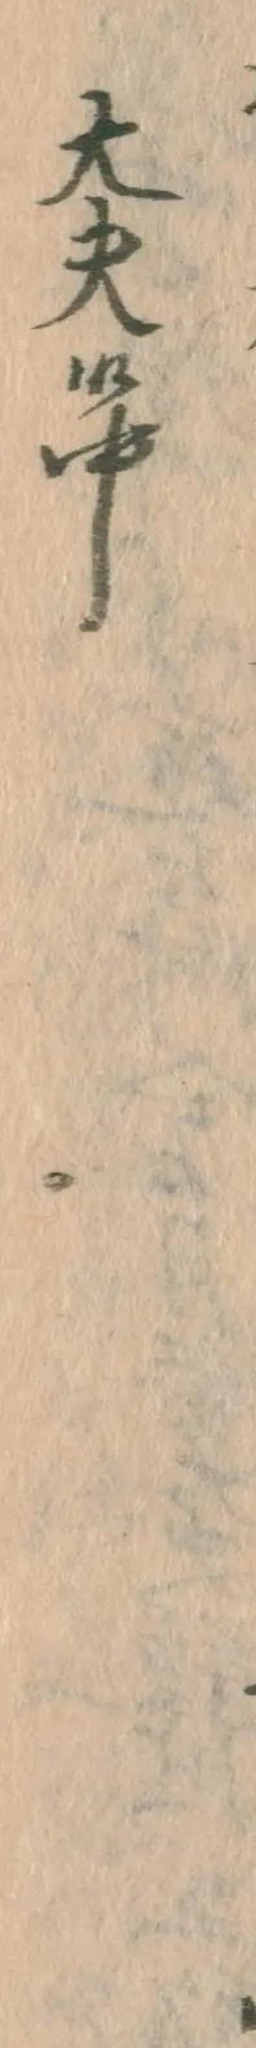大夫御中
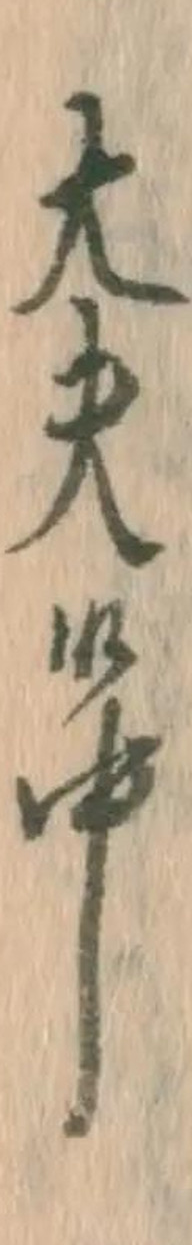大夫御中
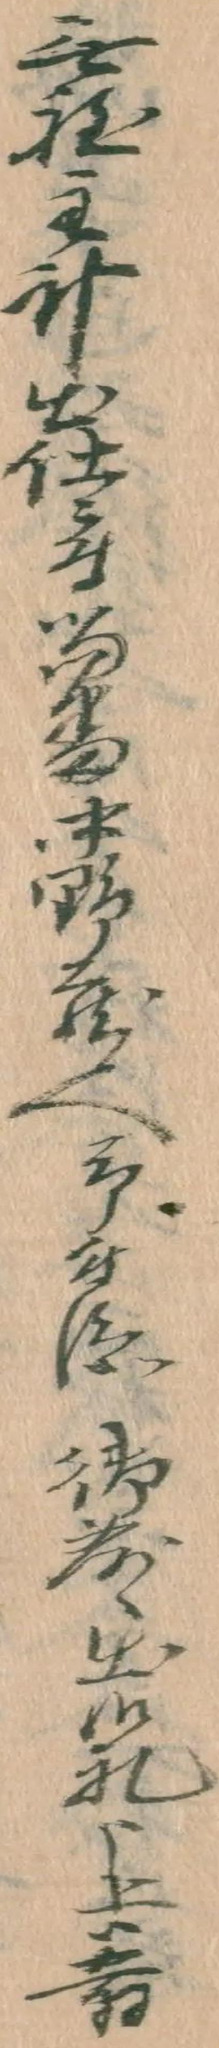無程主計出仕ニ付當番中野蔵人予付添御前へ出御礼申上御肴
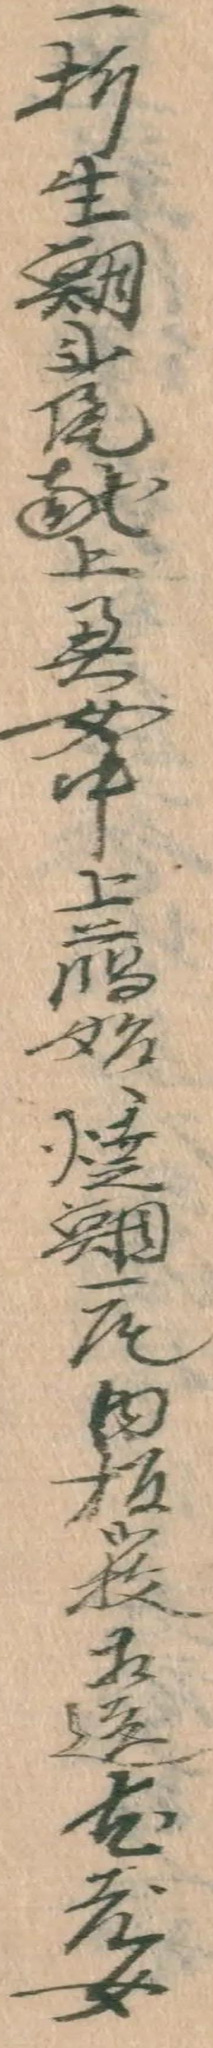一折生鯛弐尾献上奥女中上臈始へ焼鯛一尾内板弐枚相送尤老女
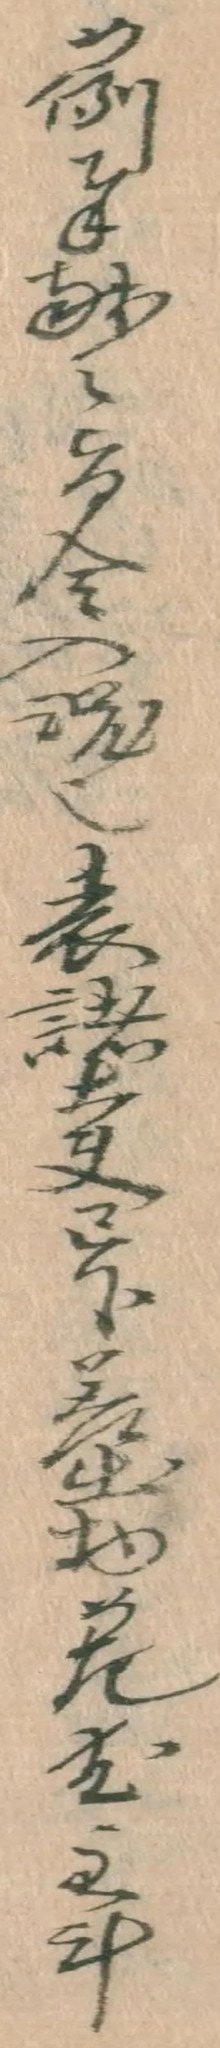如例奉献之旨令入魂也表諸大夫已下御差出物如左尤主斗
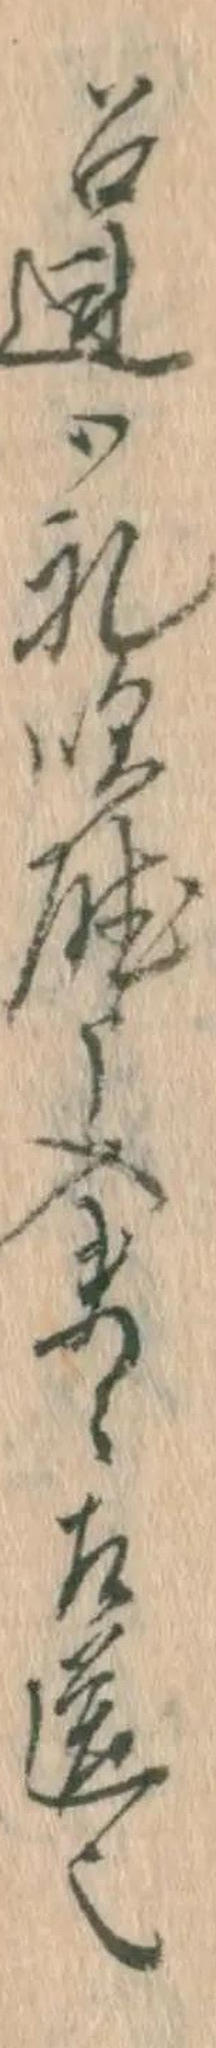召連御礼吹聴申入夫〻相送也
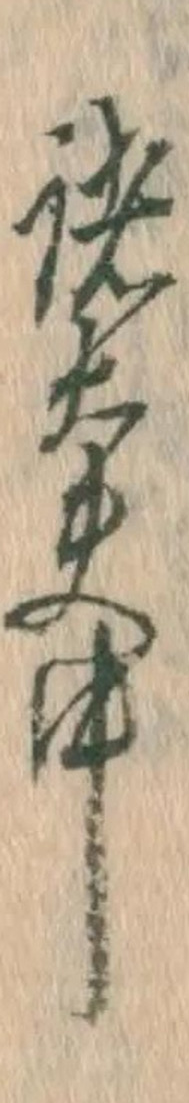諸大夫申
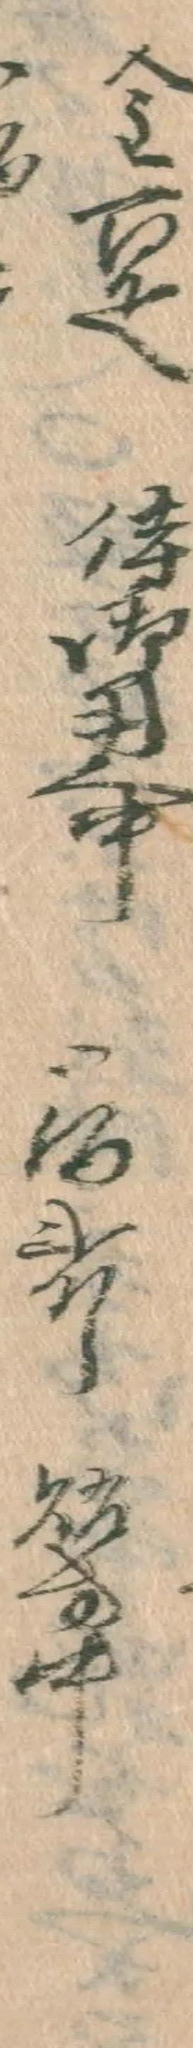金百疋侍御用人中御酒弐升賄方中
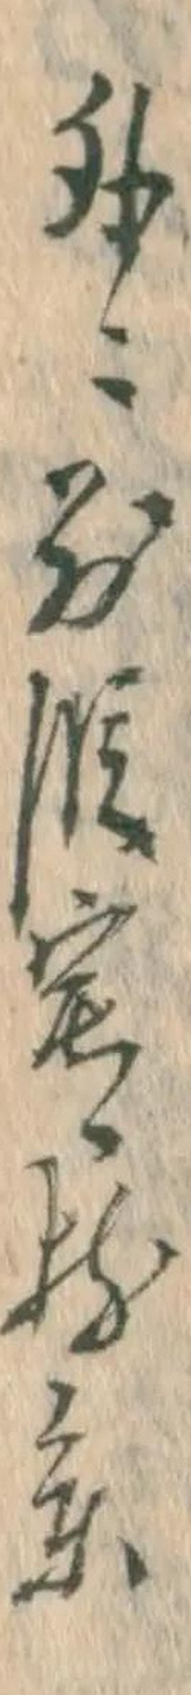外二別段密候持参
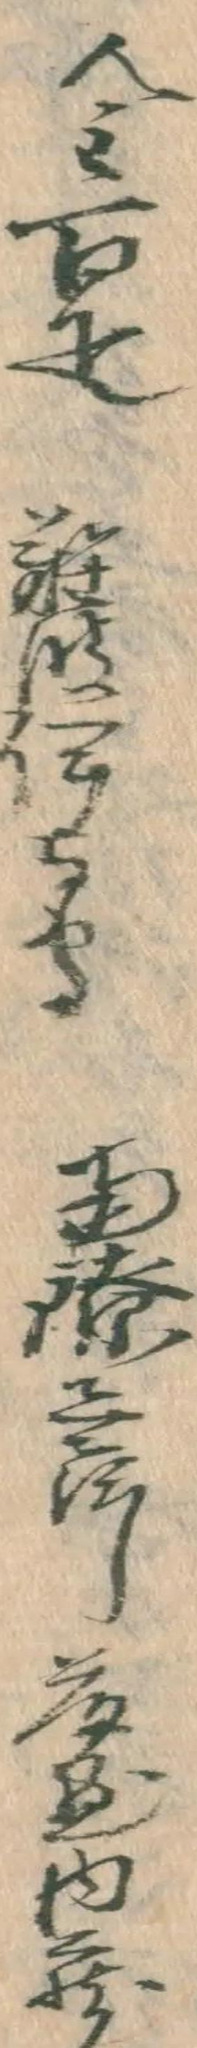金百疋難波伊予守南鐐壱片藤懸内蔵
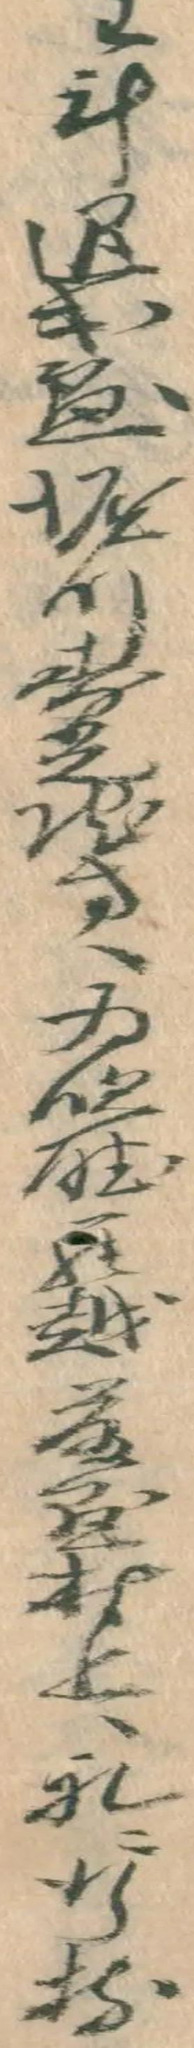主斗退出懸堀川勘定地方へ為吹聴罷越藤蔵村上へ礼に行持

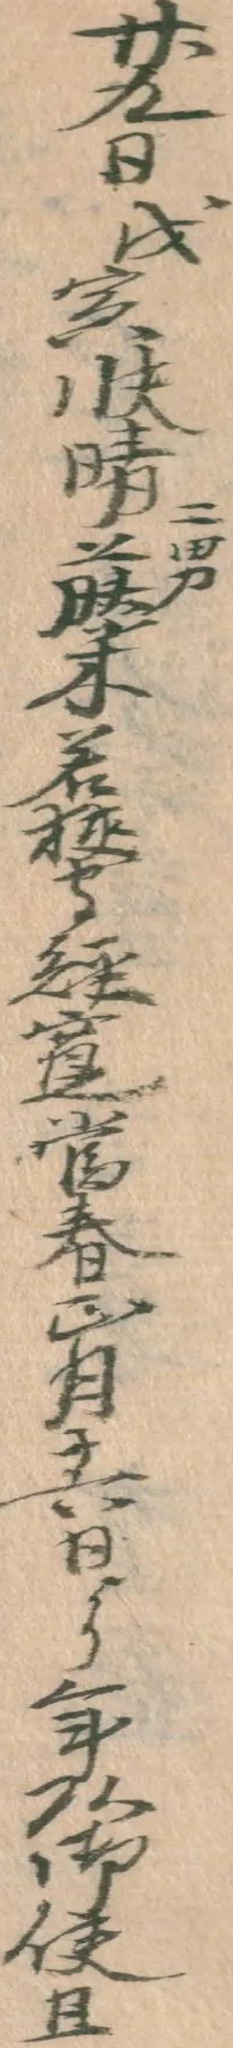廿九日戊寅快晴二男藤木若狭守経寛當春正月十六日より年頭御使且
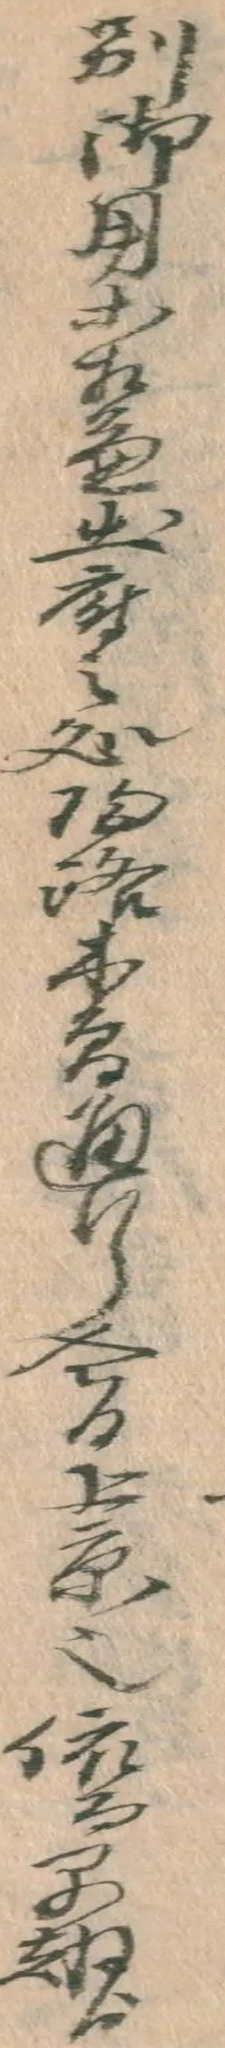別御用等相兼出府之処帰路木曽通行今日上京也依而早朝ゟ
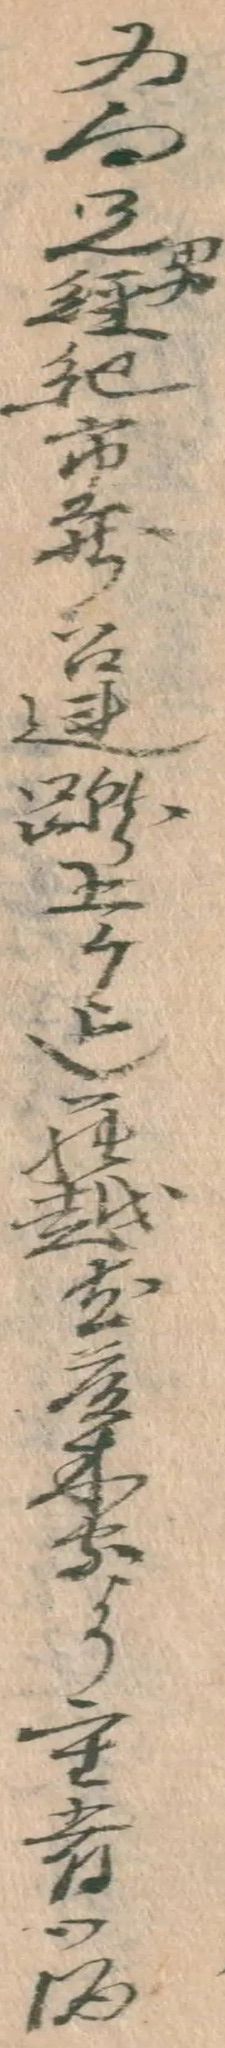為向兄男経紀市蔵召連蹴上ケ迄罷越尤藤木家より重肴御酒
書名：賀茂社記録. 第69冊
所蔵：国立国会図書館 National Diet Library, JAPAN
